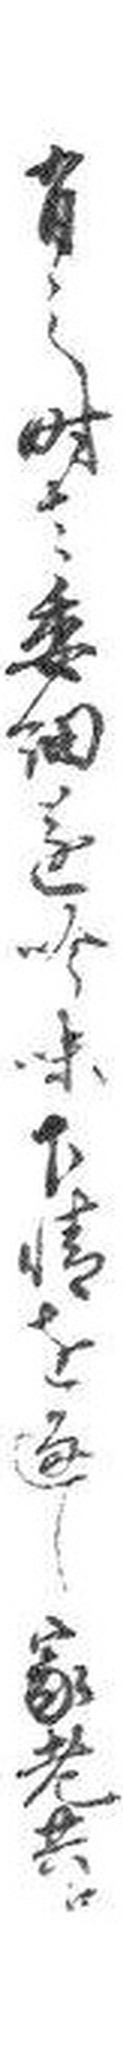有之時者委細遂吟味下情を通し家老共江
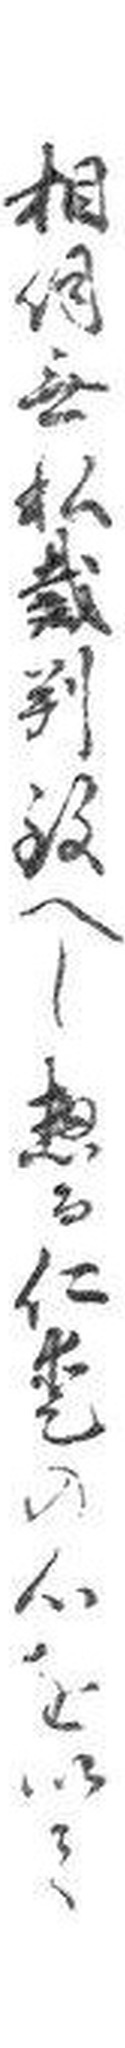相伺無私裁判致へし惣而仁愛の心を以て
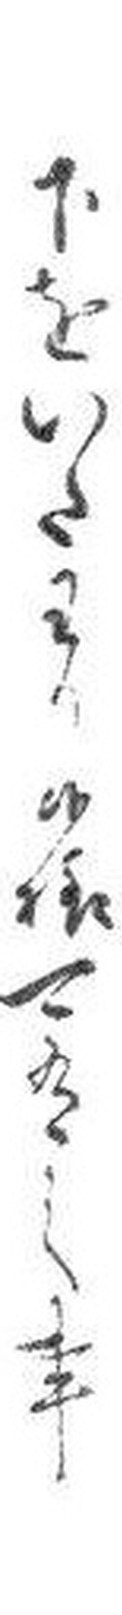下をいたわり候様可有之事
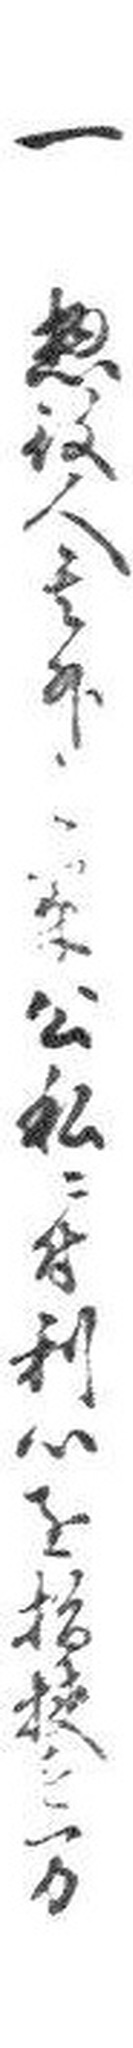一惣役人其外之輩公私ニ付利心を指挟す万
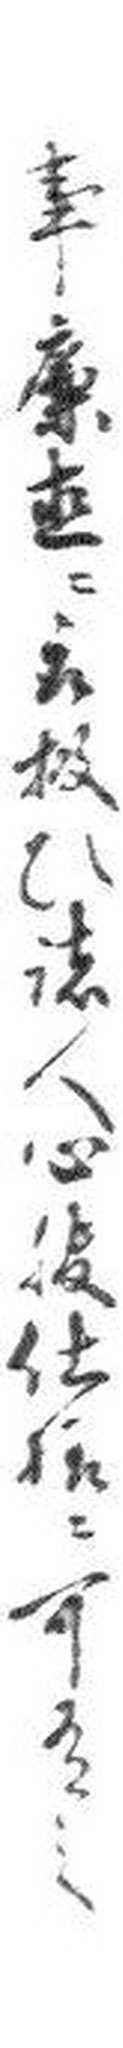事廉直ニ取扱ひ諸人心服仕様ニ可有之
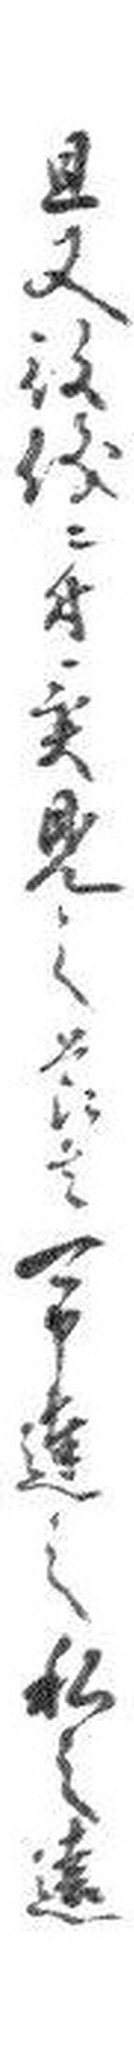且又役儀ニ付異見之節者可申達之私之遠
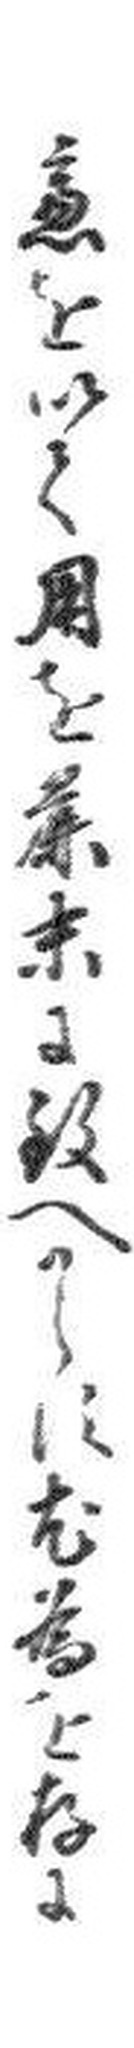慮を以て用を麁末に致へからす尤為を存に
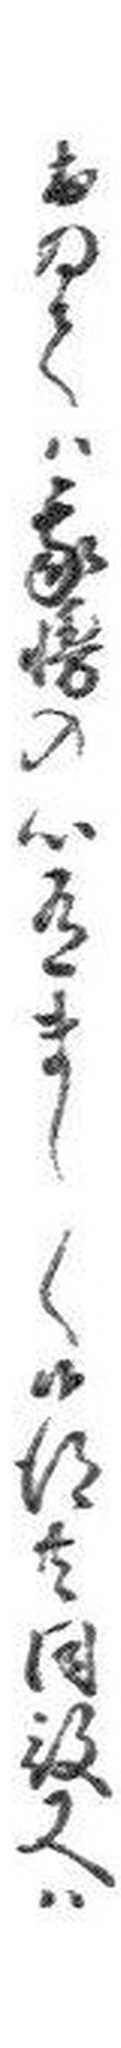おゐてハ我慢の心有ましく候得共同役又ハ
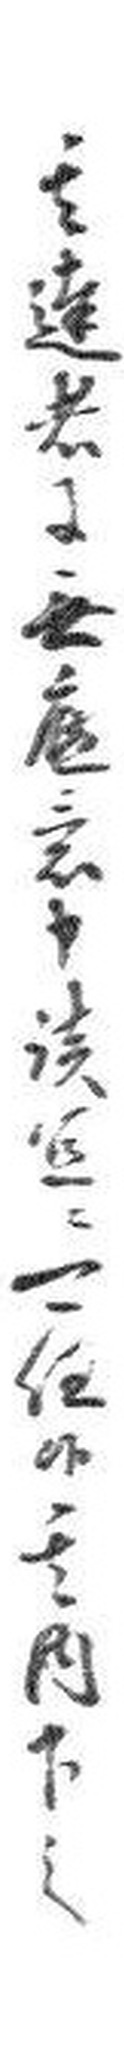其達者に無底意申談宜ニ可任候其内下之
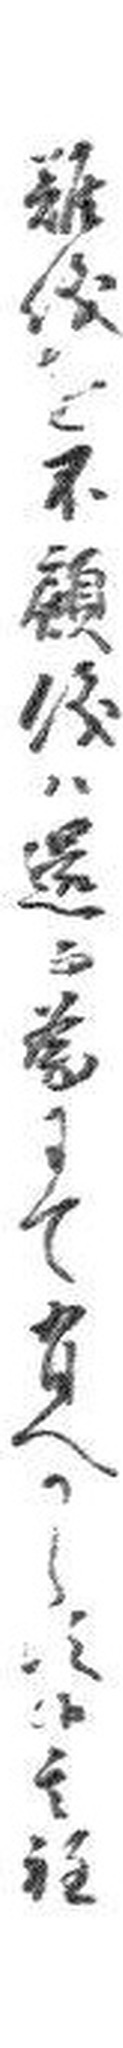難儀を不顧儀ハ還而為にて有へからす候其程
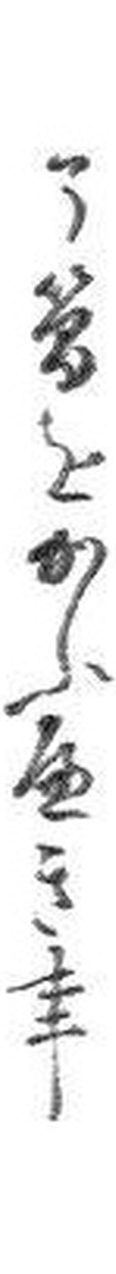了簡を加ふへき事
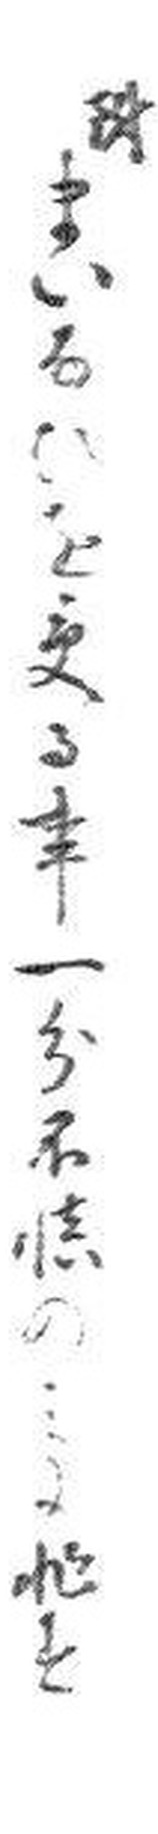まいなひを受る事一分不慎のミに非す
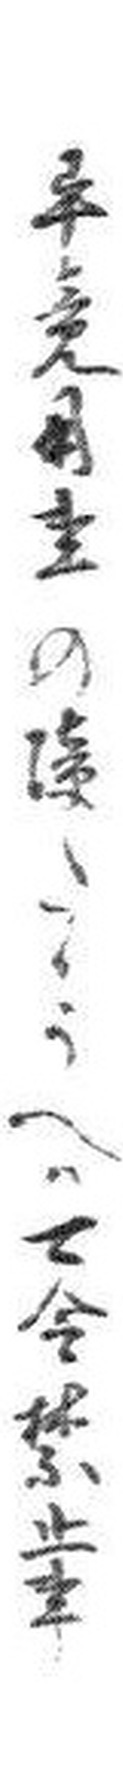畢竟用事の障たるうへハ可令禁止事
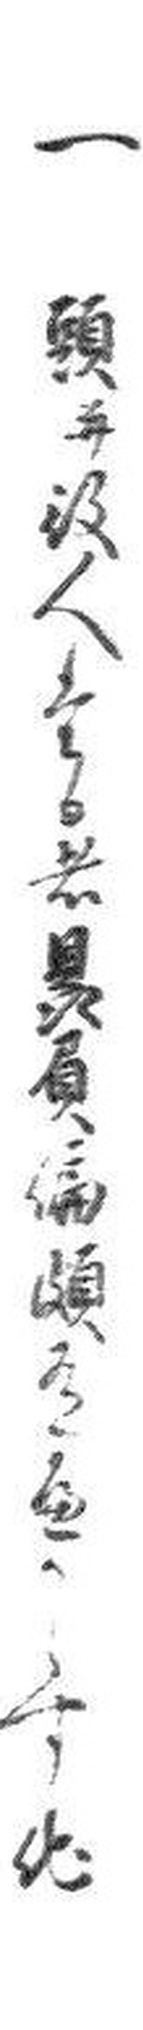一頭并役人たる者贔屓偏頗有へからす他
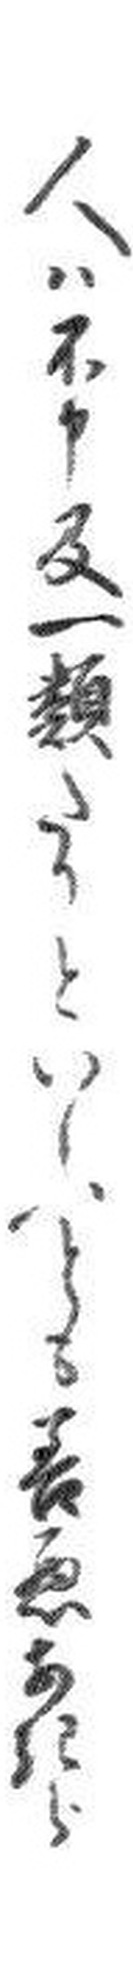人ハ不申及一類たりといふとも善悪あきら

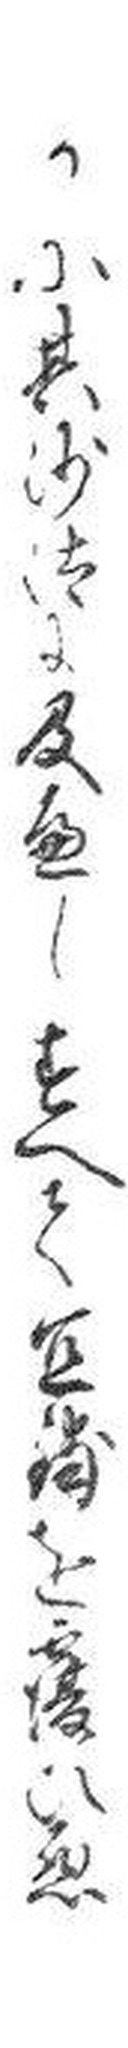かに其沙汰に及へしすへて宜鋪を覆ひ悪
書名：家譜 二十八 吉邦公 従宝永七年七月五日到正徳元年十二月
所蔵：福井県文書館 Fukui Prefectural Archives
